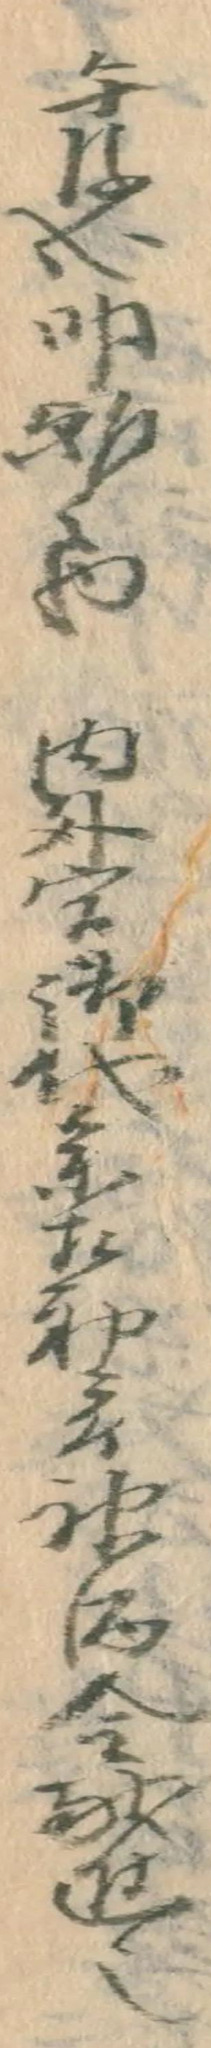午後明朝之内内外宮御代参相勤ニ付神酒令献進也

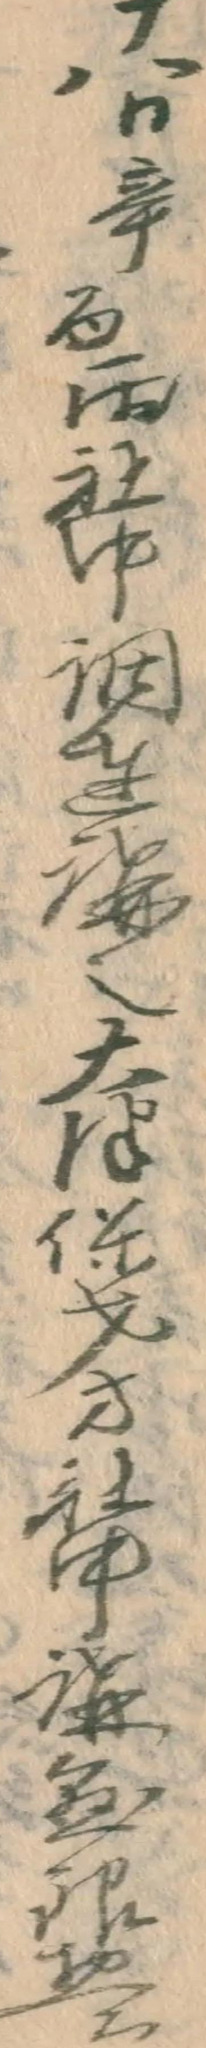十八日辛酉雨社中調達講也大津保才方社中講懸銀惣而
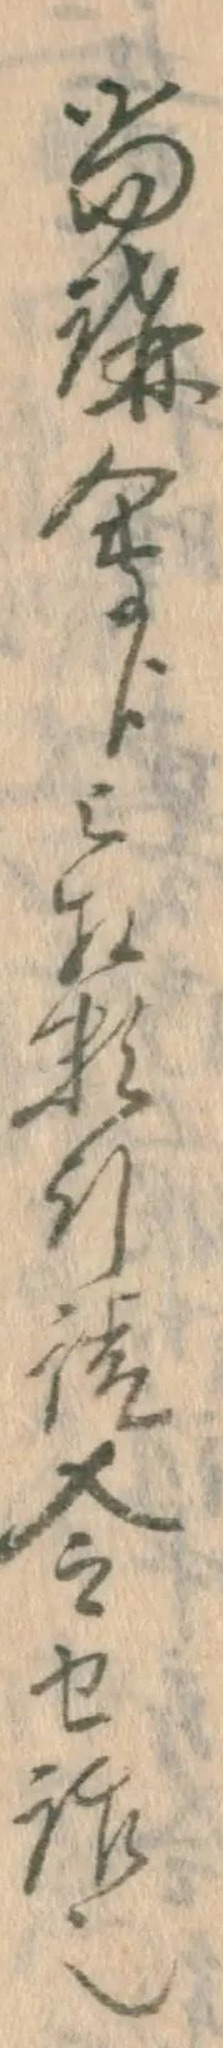當講會ゟ被相頼引請令世話也
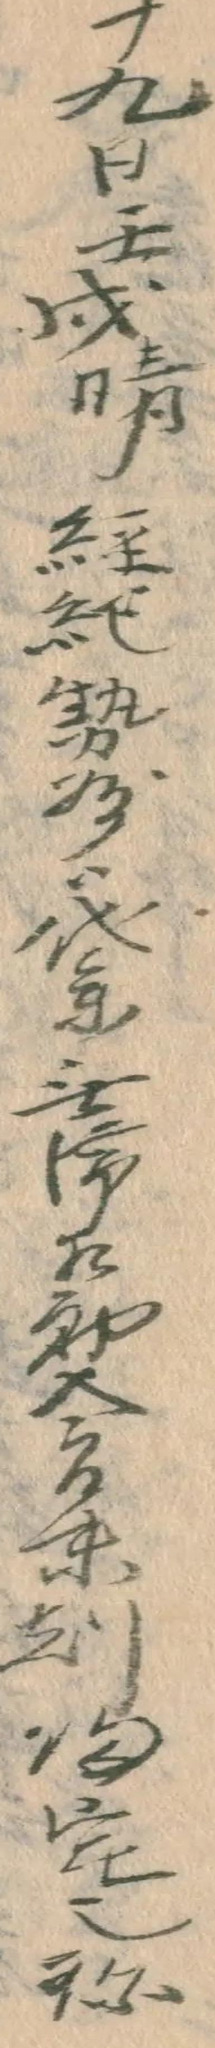十九日壬戌晴経紀勢州御代参無滞相勤今日未刻帰宅也珍
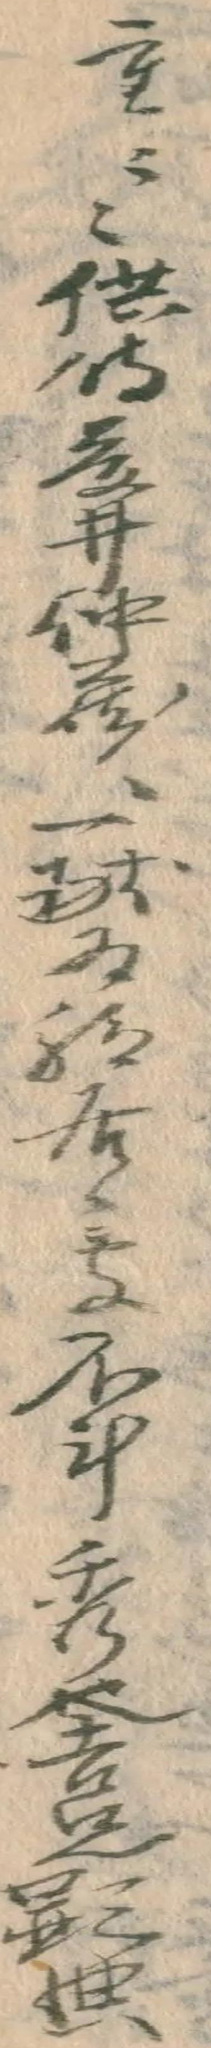重々々供侍藤井仲蔵へ一献為給居候處不斗秀舎兄顕典
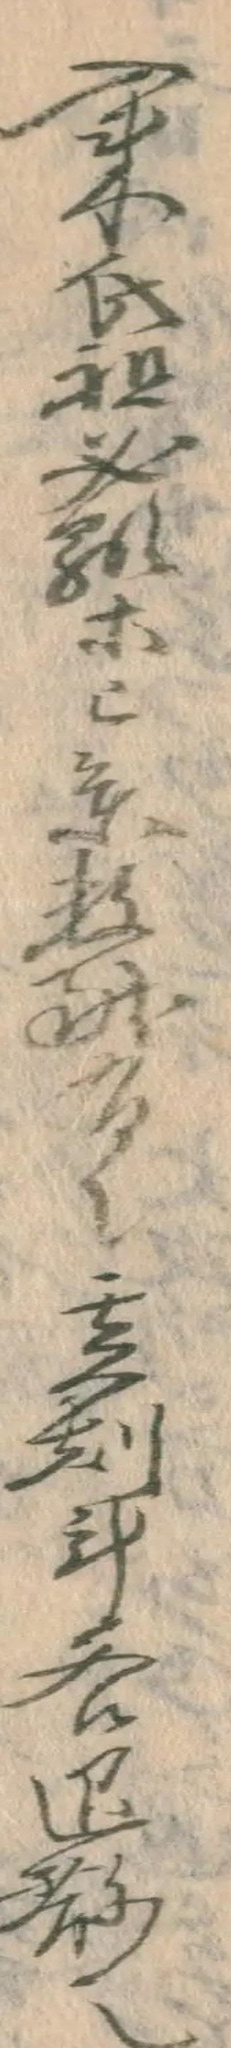入来氏祖必顕等被参数献有之亥刻斗各退散也
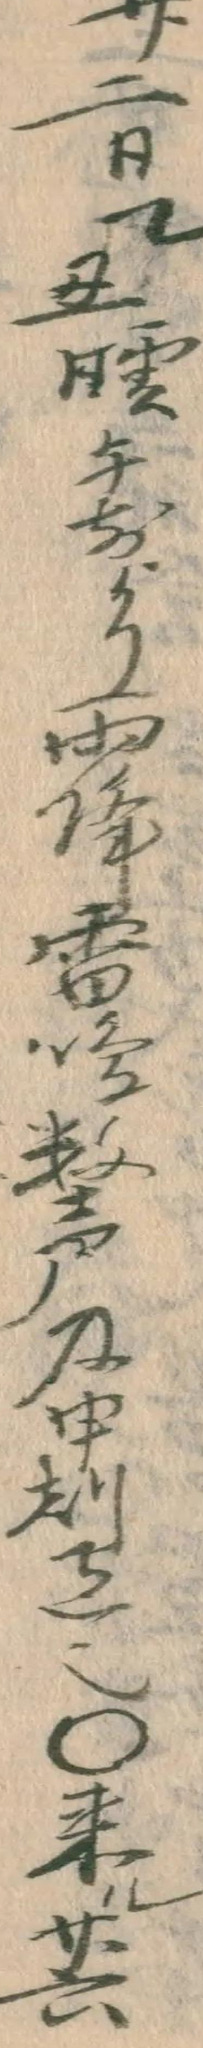廿二日乙丑曇午前より雨降雷鳴数声及申刻過也○来ル廿六
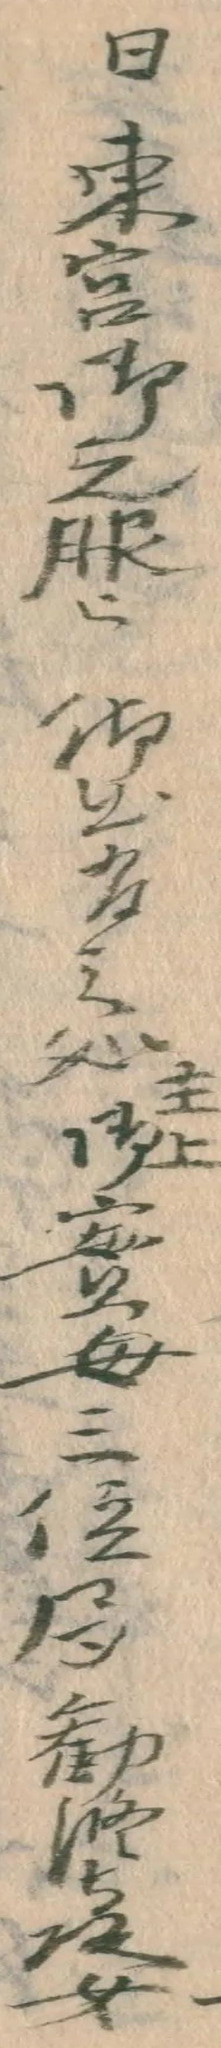日東宮御元服被仰出有之処主上御實母三位局勧修寺殿女
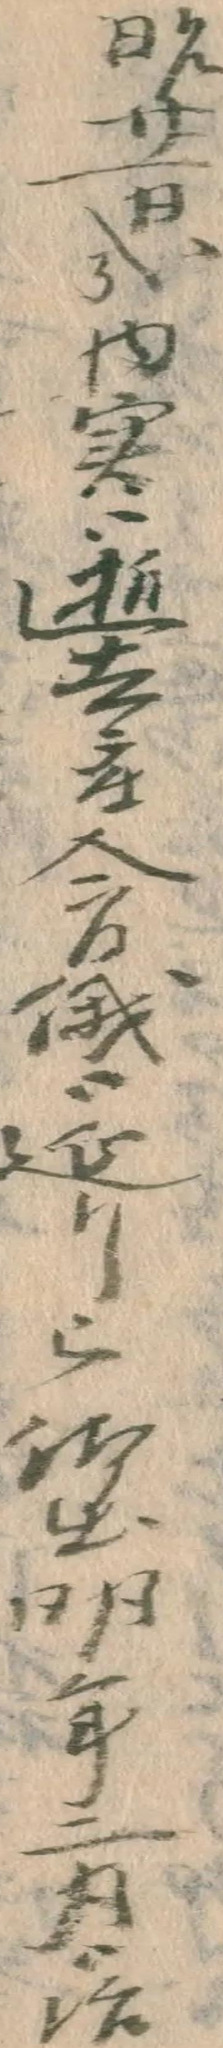昨廿一日引内実御逝去ニ付今日俄御延引被仰出明年三月御治
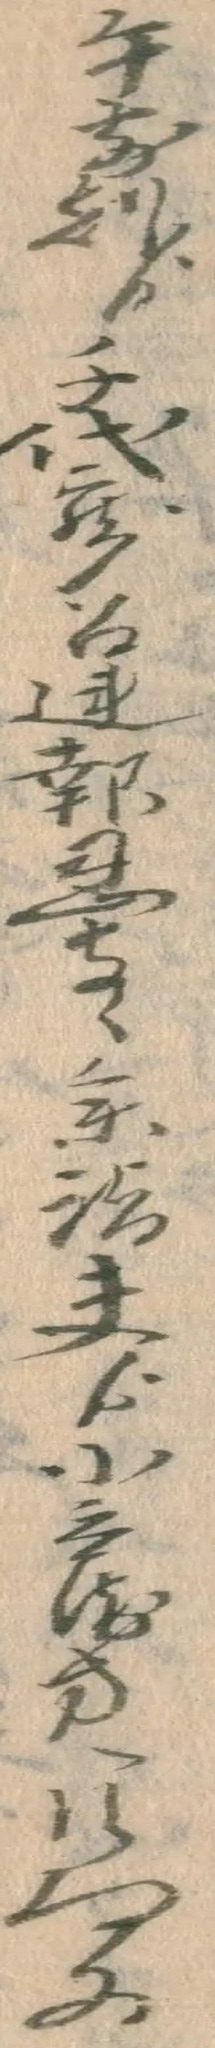午前刻ゟ千代蔵召連報恩寺へ参詣夫ゟ小兵衛方へ引向為
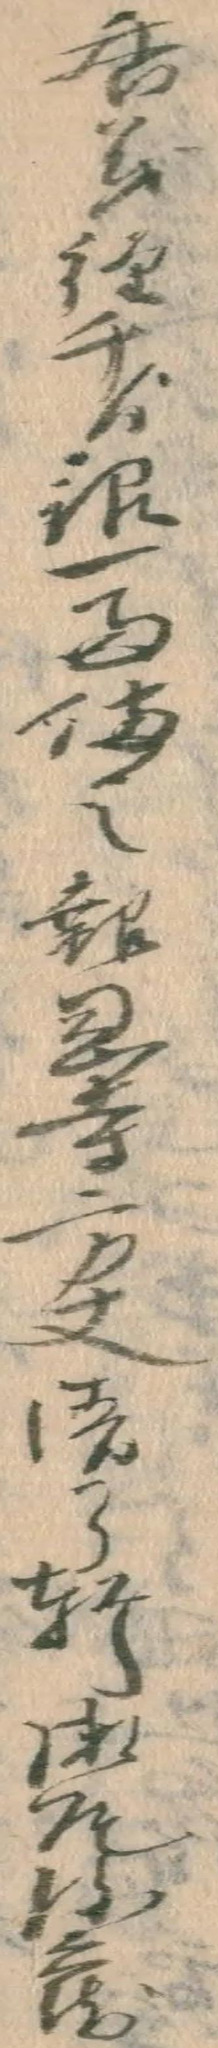香義軽千ゟ銀一両備也報恩寺方丈傍之軒瀬尾弥兵衛
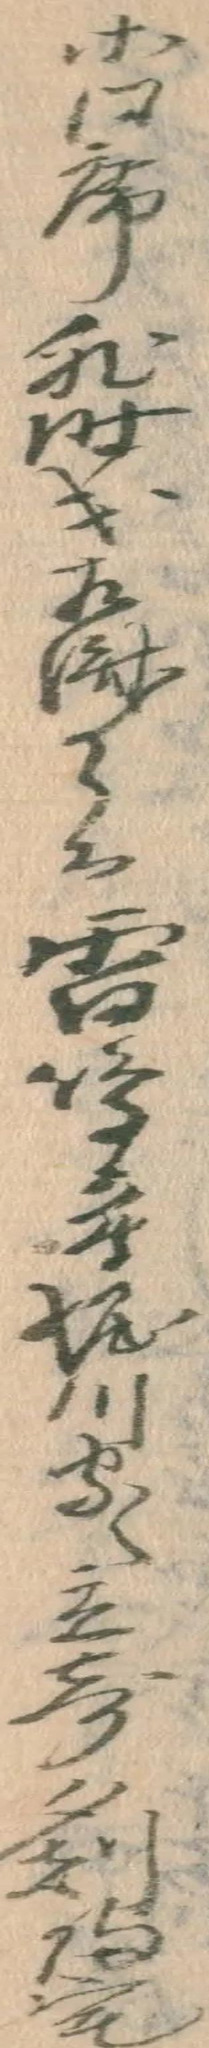等同席非時出相済了而雷鳴ニ付堀川家へ立寄夕刻帰宅也
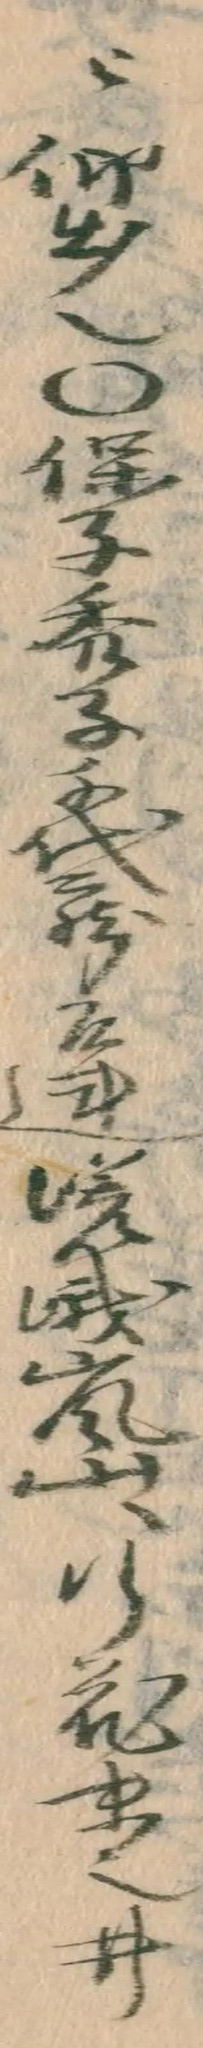被仰出也○保子秀子千代蔵召連嵯峨嵐山へ行花末也井
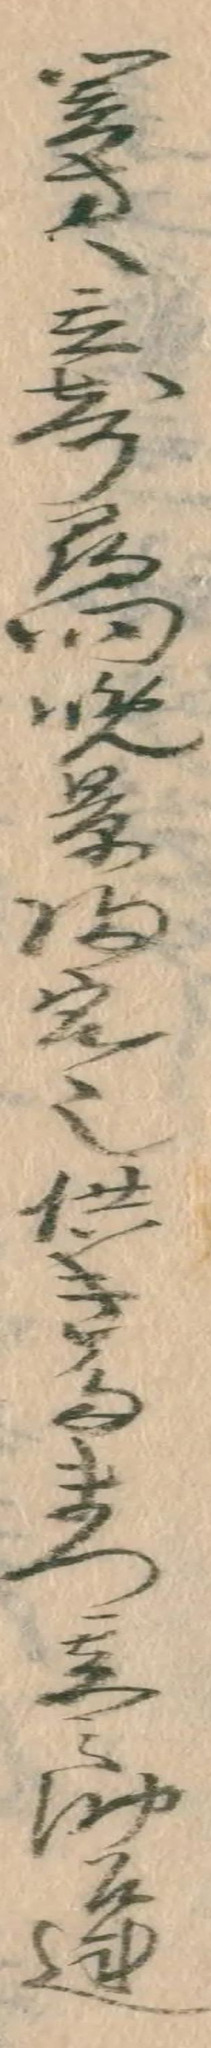関方へ立寄尋向晩景帰宅也供きたまつ亥之助召連
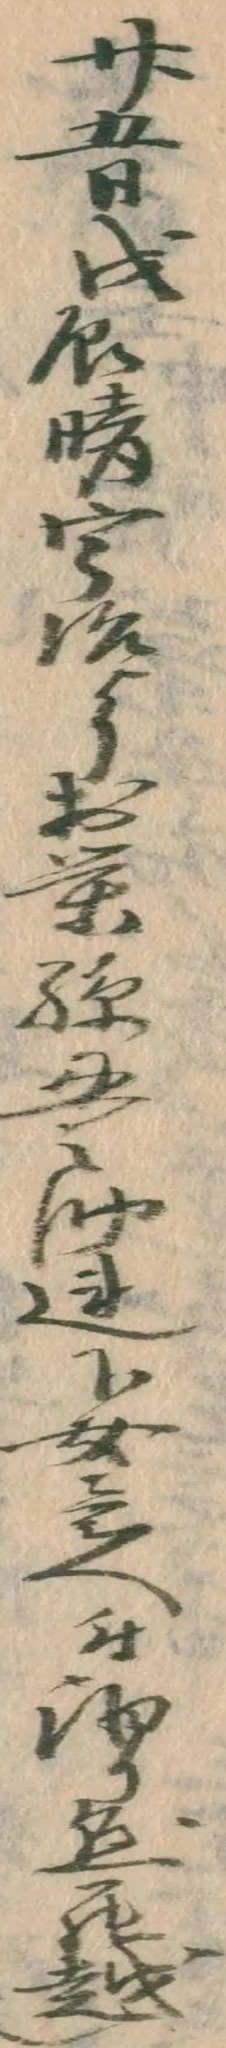廿五日戊辰晴宇治よりお栄孫丑之助連下女壱人付泊り惣罷越也
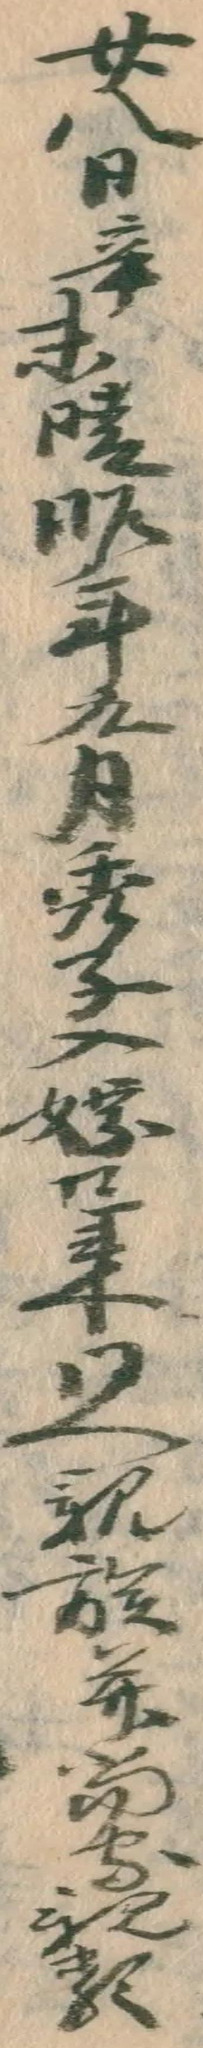廿八日辛未晴昨年九月秀子入嫁已来同人親族并當家親類
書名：賀茂社記録. 第69冊
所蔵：国立国会図書館 National Diet Library, JAPAN
